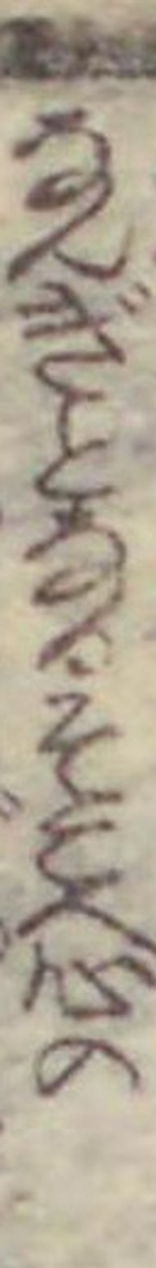なんぎとなるそこへ心の
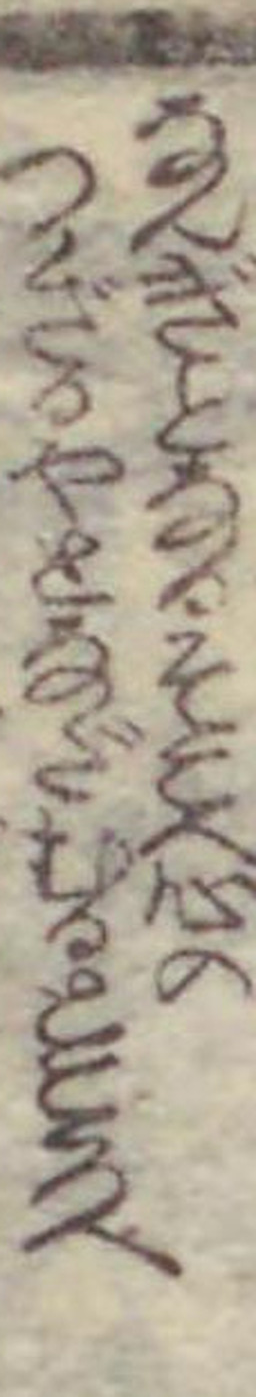つかざるやとなだむるところへ
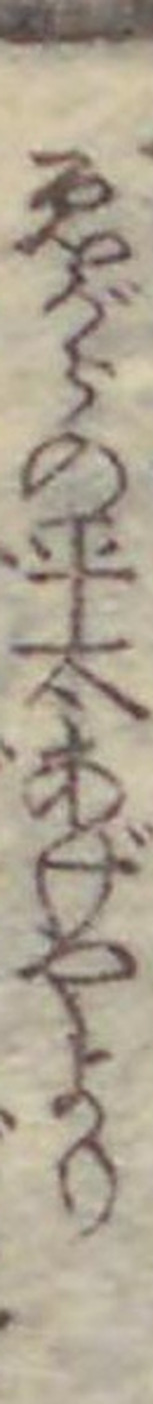ゑがらの平太あげやより
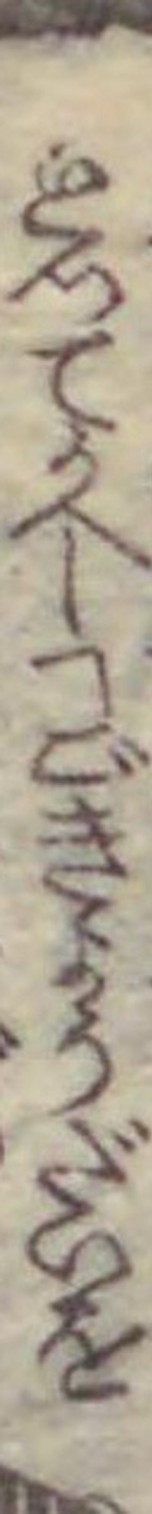とつてかへし〽ごきようだいを
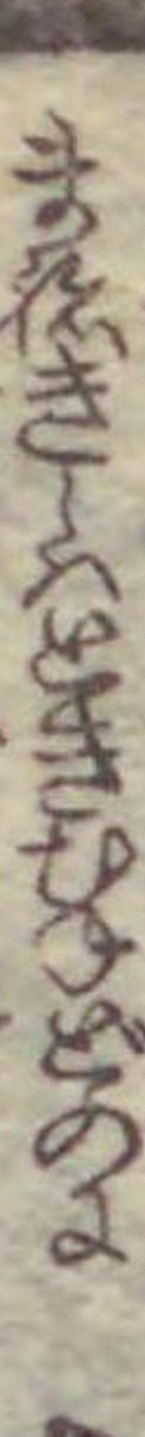まねきしはときむねどのに
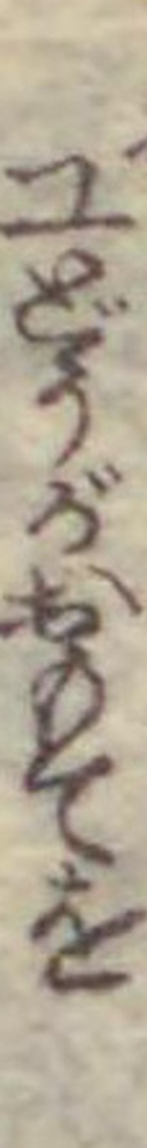工どうがおもてを
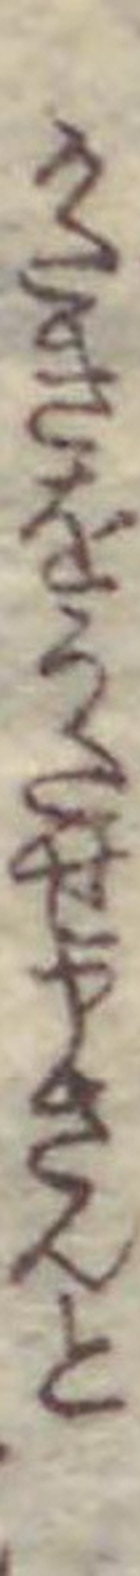かたきをうたせ申さんと
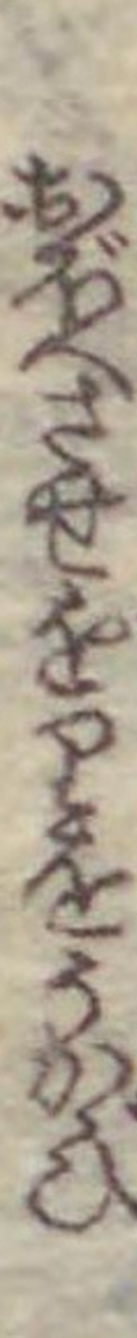おぼへさせをりをうかゞひ
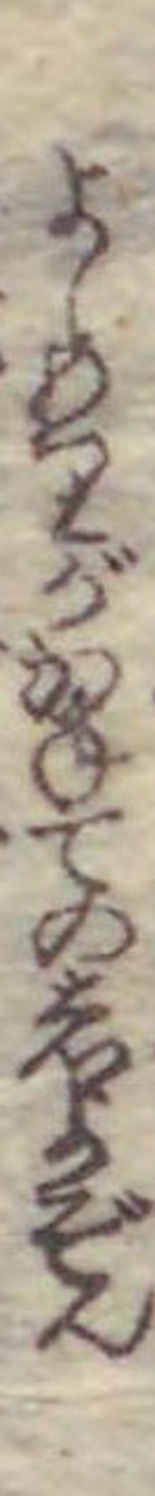よしもりがかねてのしよぞん
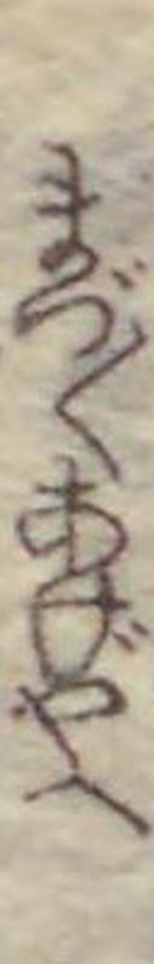まづ〳〵あげやへ
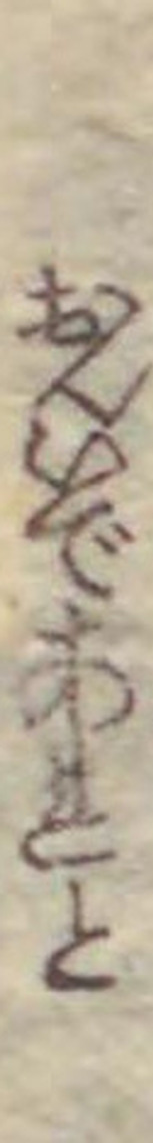おんいであれと
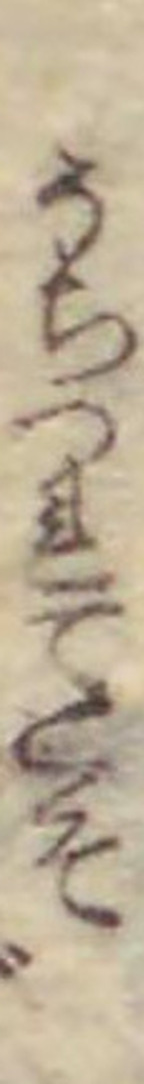うちつれてこそ
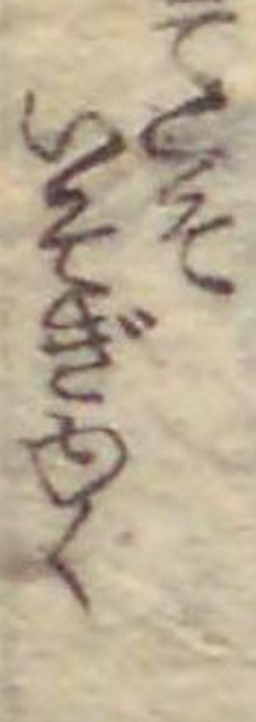いそぎゆく

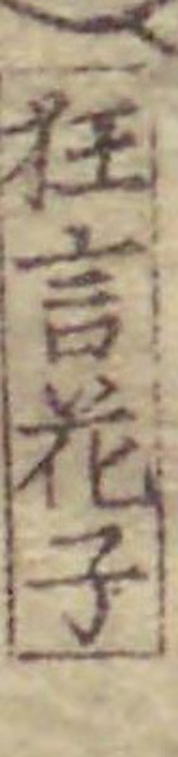狂言花子
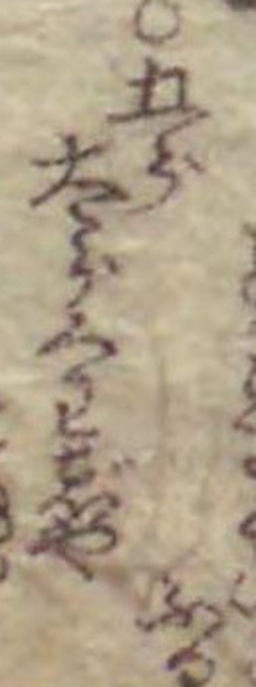太郎くわじや

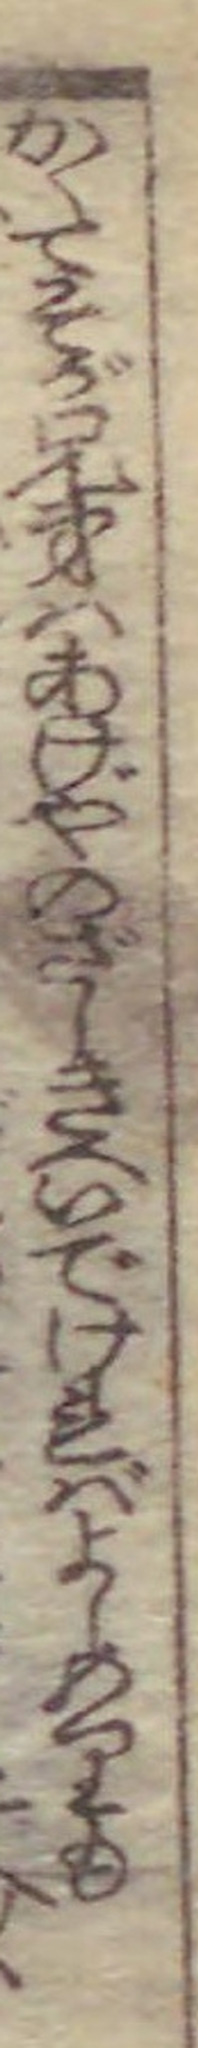かくてそが兄弟はあげやのざしきへいでければよしもりも
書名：大時代唐土化物 3巻. 曽我太夫染
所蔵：国立国会図書館 National Diet Library, JAPAN
